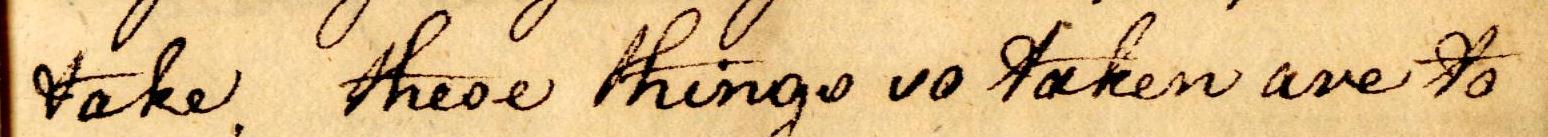take, there things so taken are to
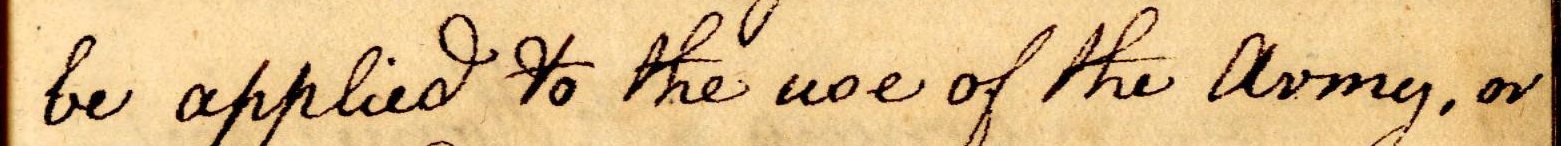be applied to the use of the Army, or
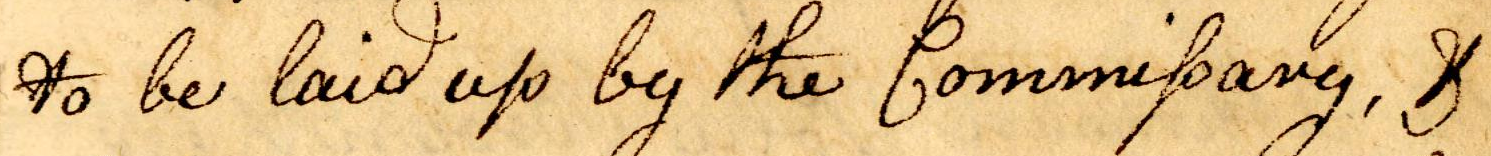to be laid up by the Commissary, &
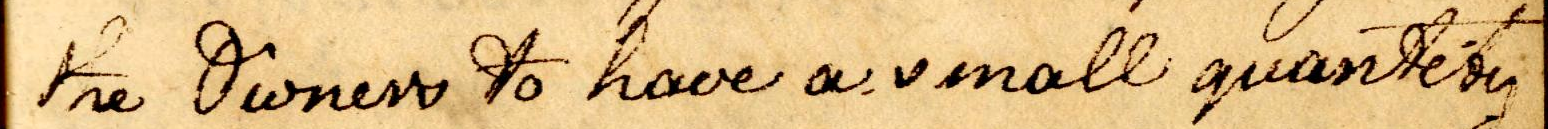the Owners to have a small quantity
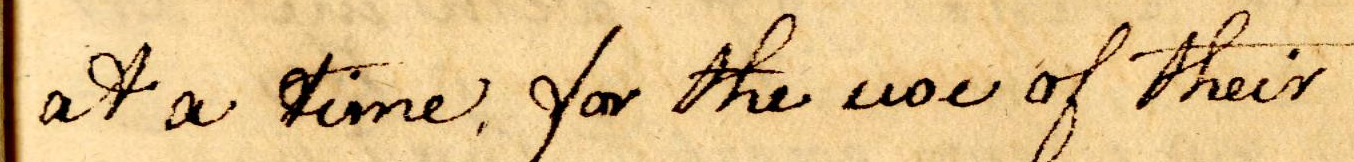at a time, for the use of their
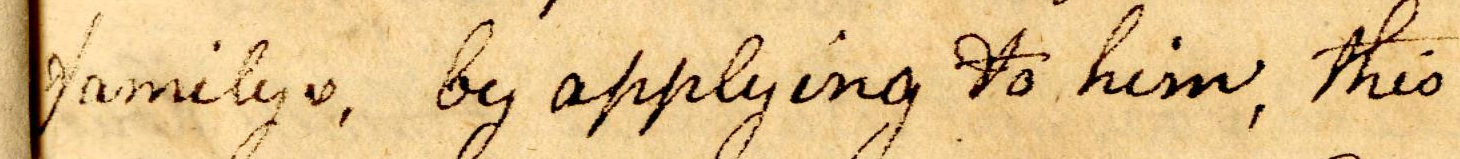familys, by applying to him, this
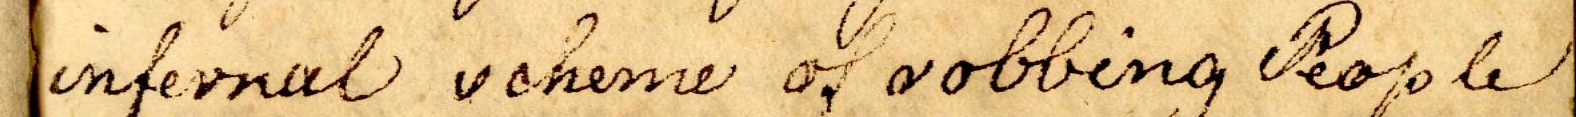infernal scheme of robbing People
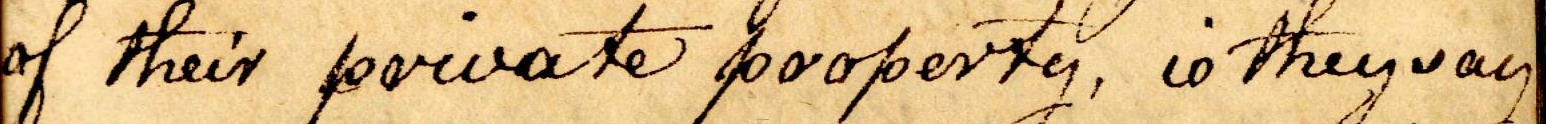of their private property, is they say
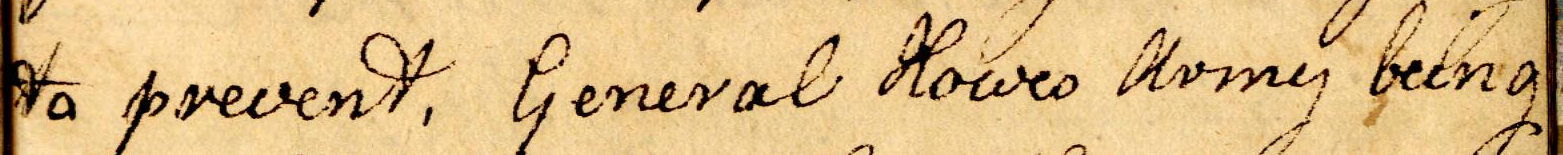to prevent, General Howes Army being
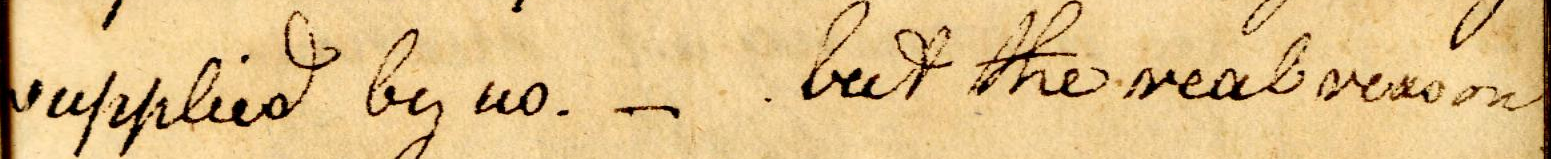supplied by us.- but the real reason
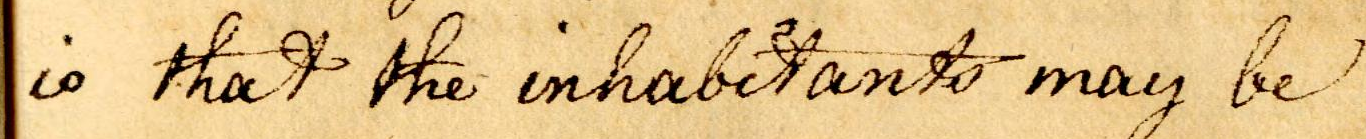is that the inhabitants may be
